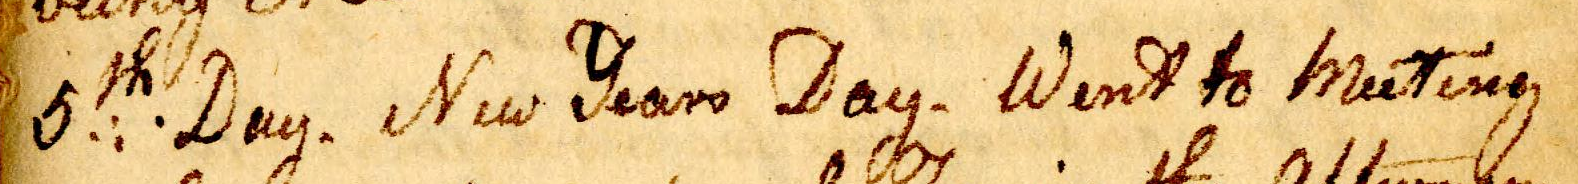5^th Day- New Years Day- Went to Meeting
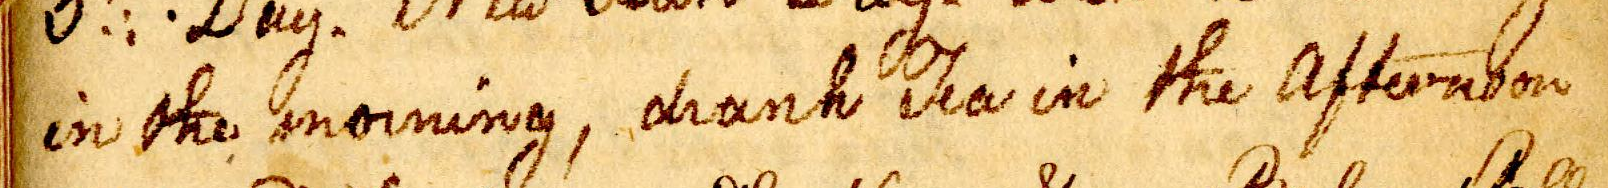in the morning, drank Tea in the Afternoon
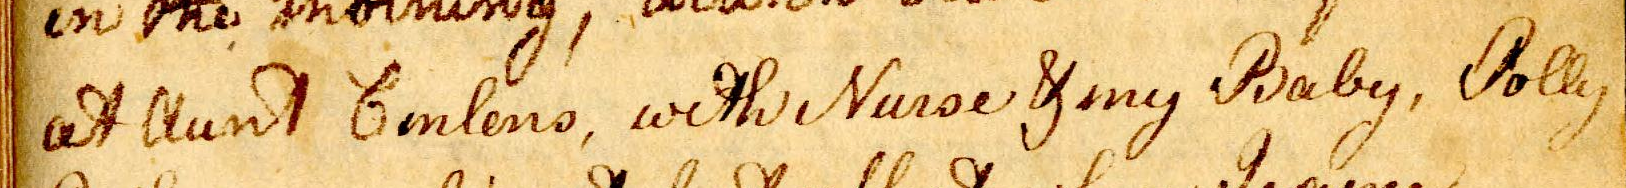at Aunt Emlens, with Nurse & my Baby, Polly
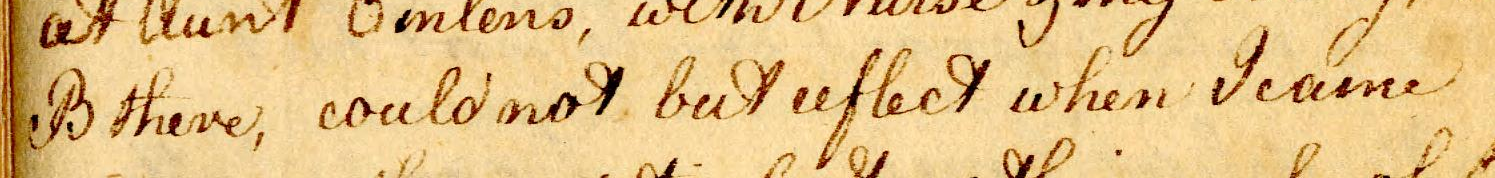B there, could not but reflect when I came
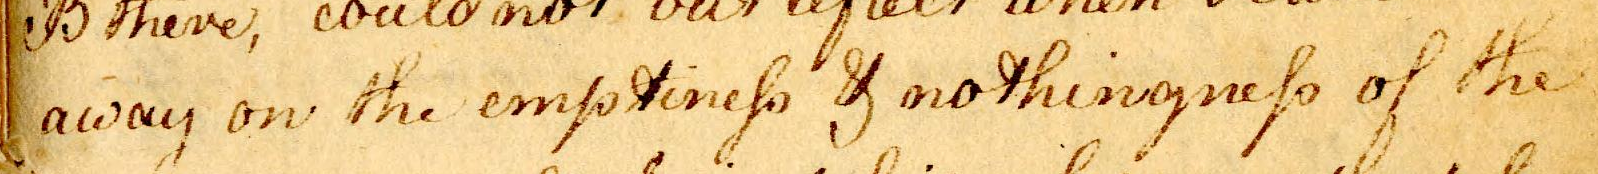away on the emptiness & nothingness of the
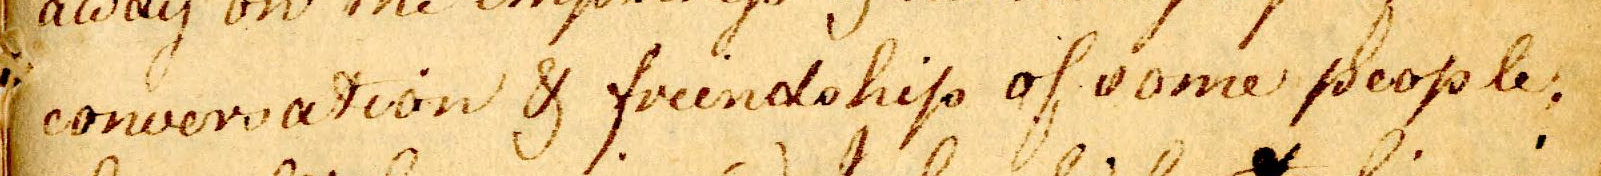conversation & friendship of some people,
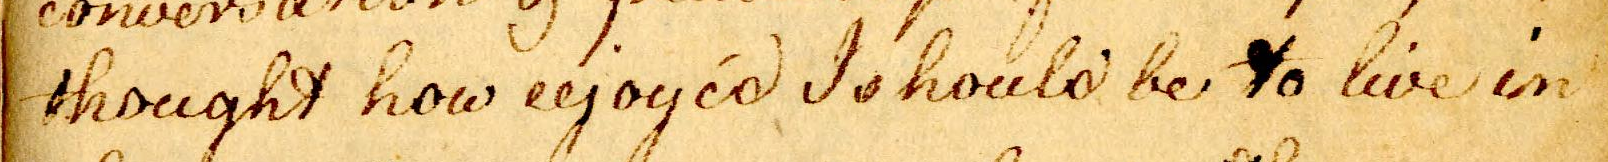thought how rejoyc'd I should be to live in
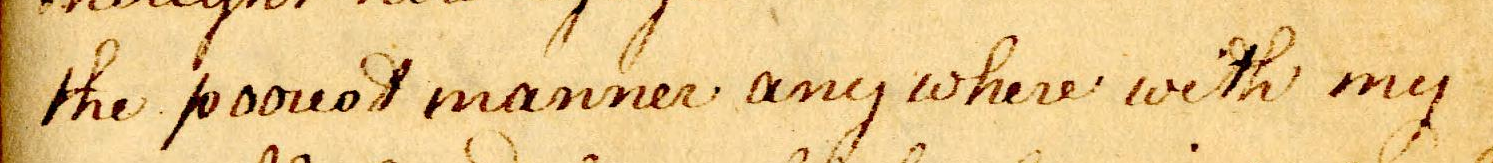the poorest manner any where with my
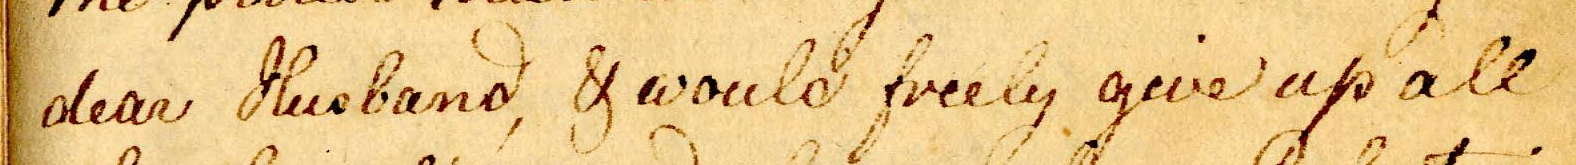dear Husband, & would freely give up all
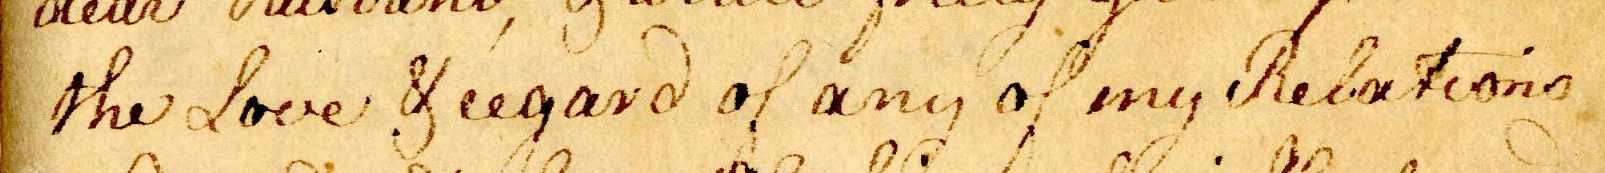the Love & regard of any of my Relations
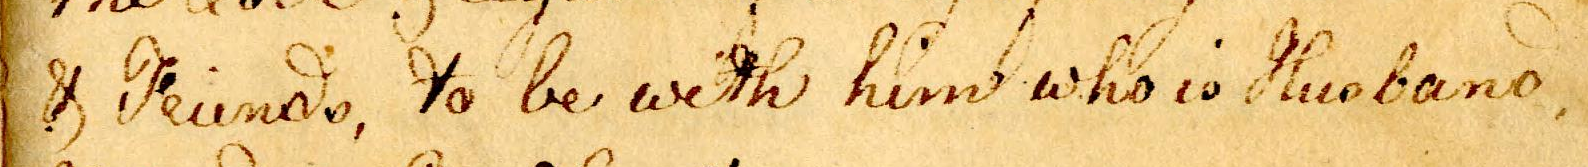& Friends, to be with him who is Husband,
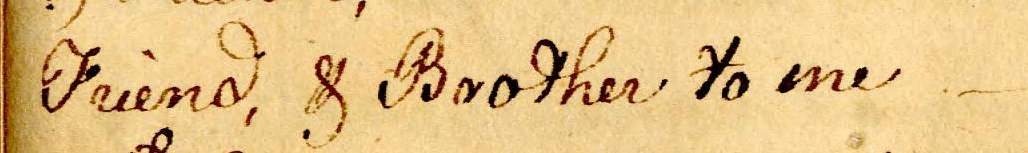Friend, & Brother to me-
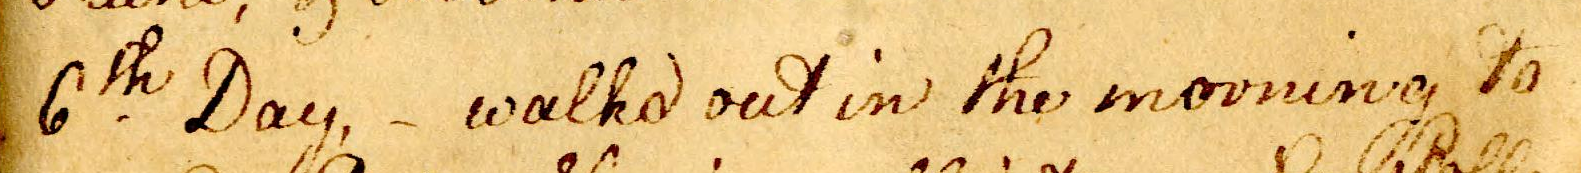6^th Day,- walkd out in the morning to
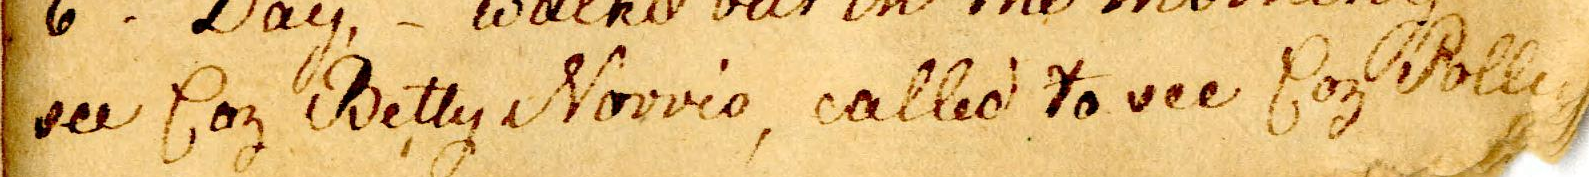see Coz Betty Norris, called to see Coz Polly
